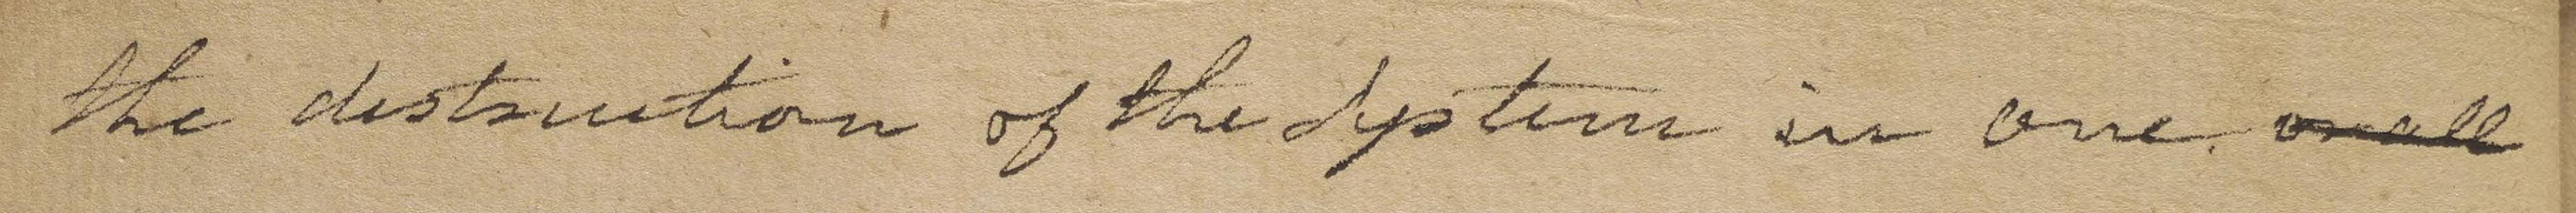the destruction of the System in one [or all]
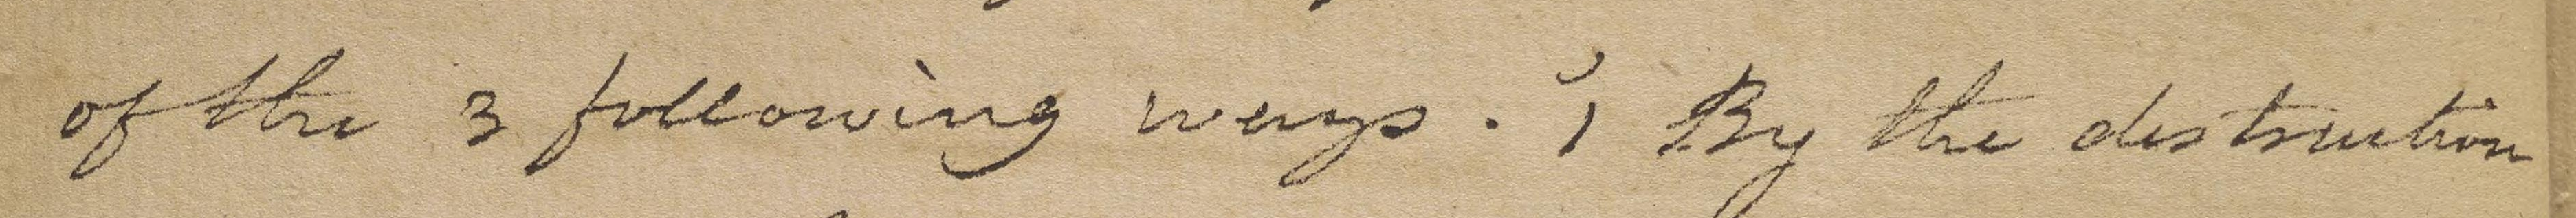of the 3 following ways. 1 By the destruction
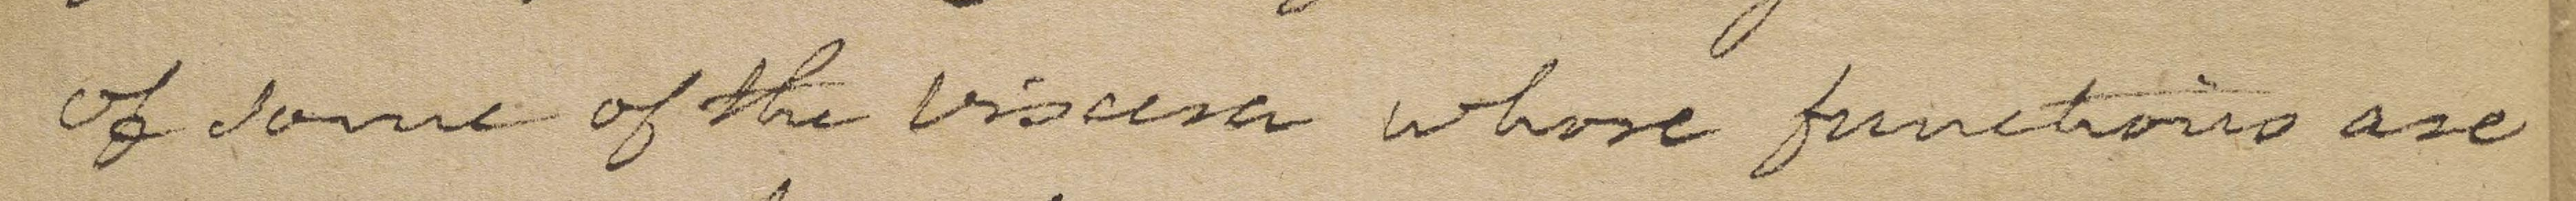of some of the viscera whose functions are
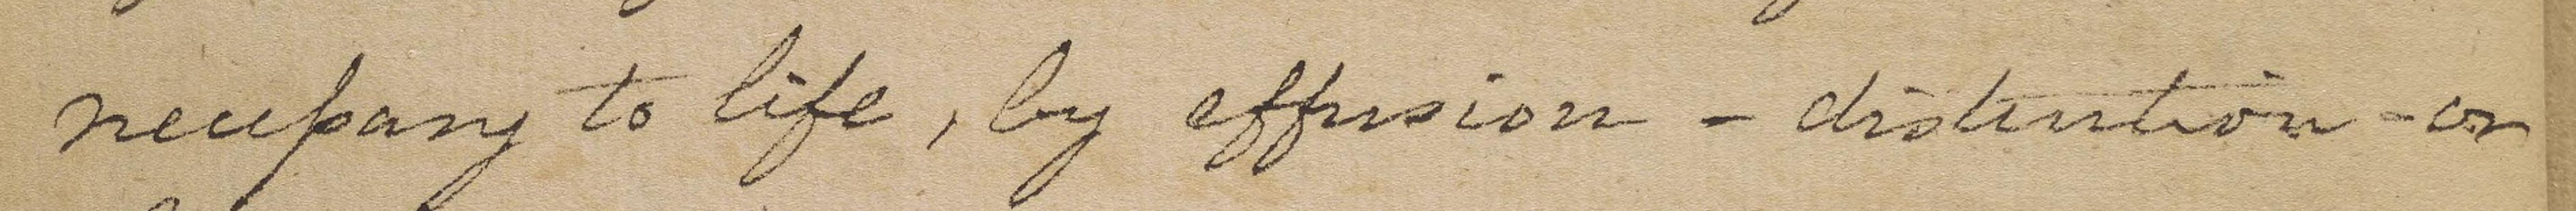necessary to life, by effusion- distintion- or
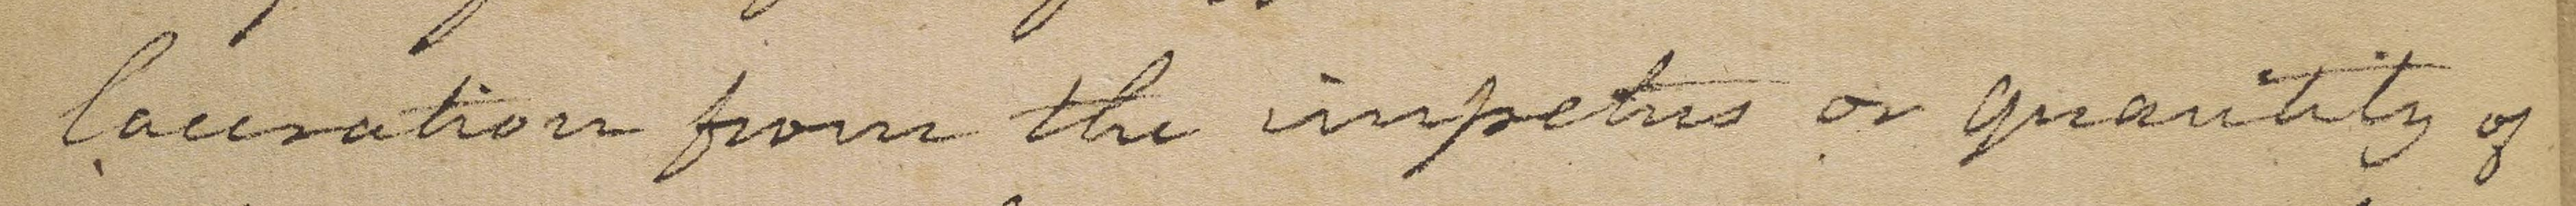laceration from the impetus or quantity of
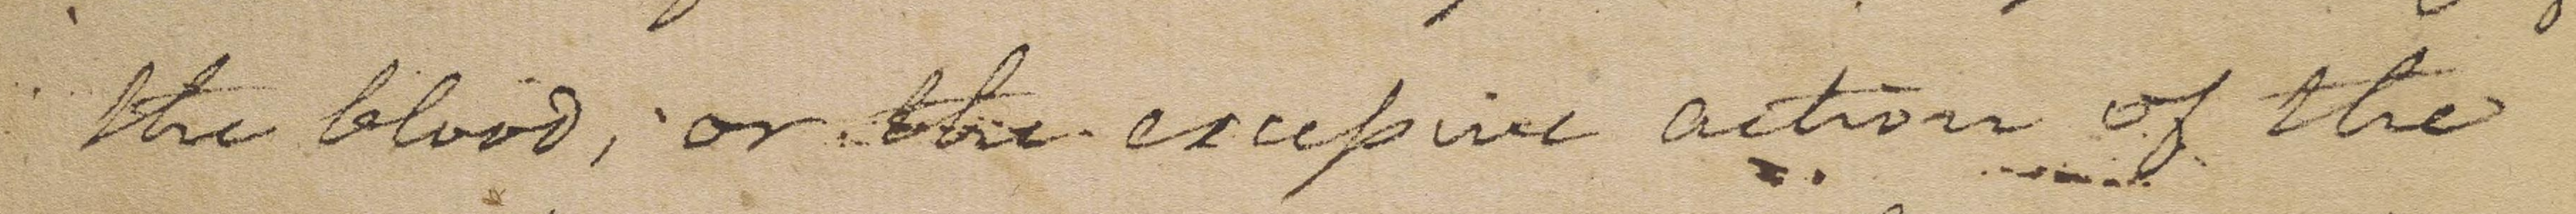the blood, or the excessive action of the
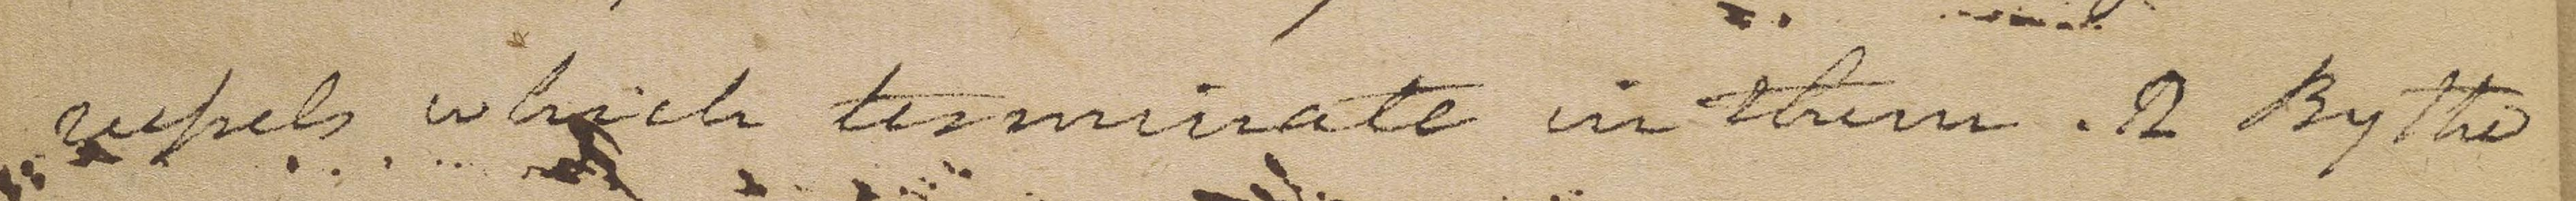excess which terminate in them. 2 By the
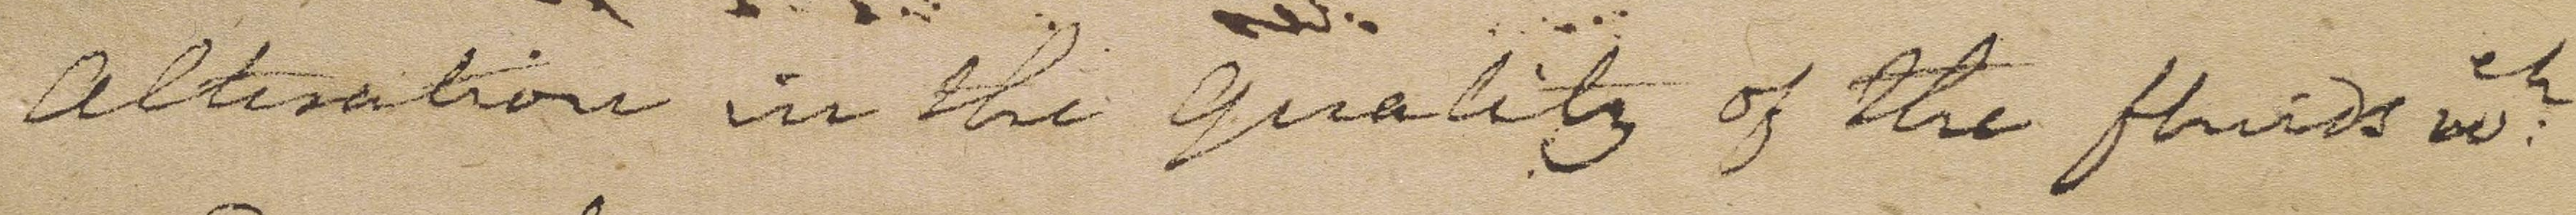alteration in the quality of the fluids w^ch
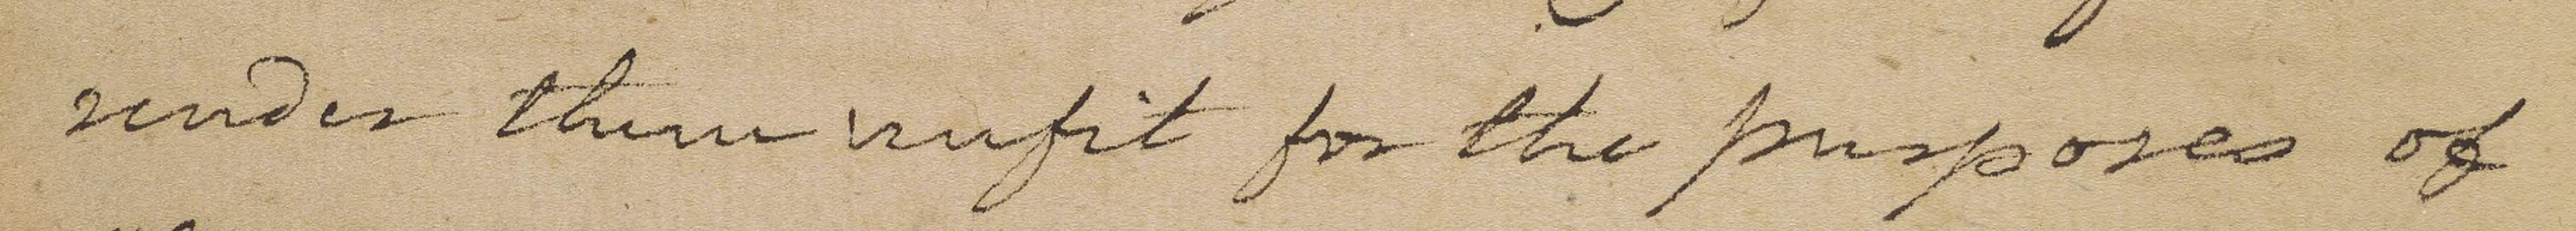render them unfit for the purposes of
